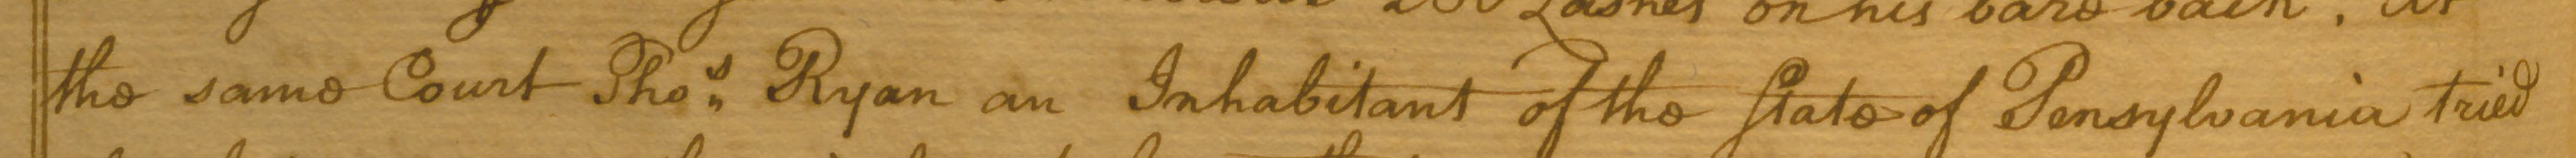the same Court Tho^s. Ryan an Inhabitant of the state of Pensylvania tried
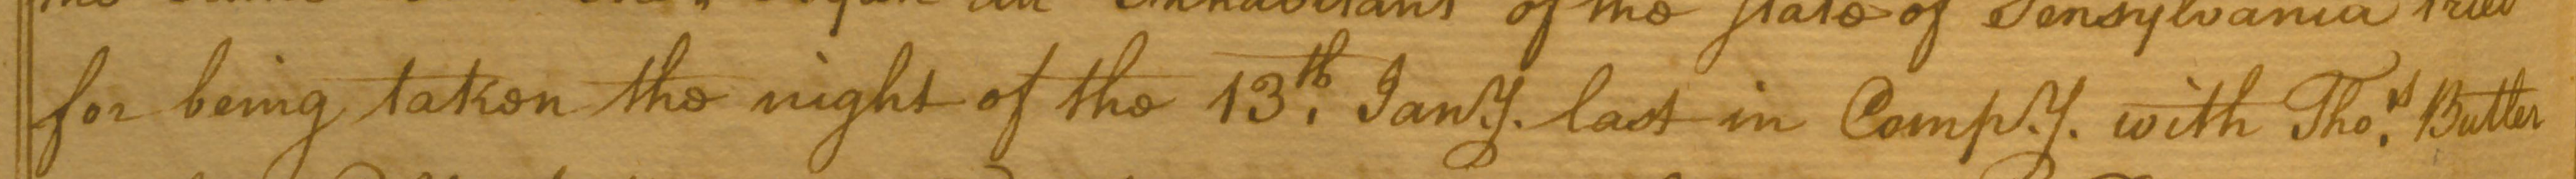for being taken the night of the 13^th. Jan^y. last in Comp^y. with Tho^s. Butler
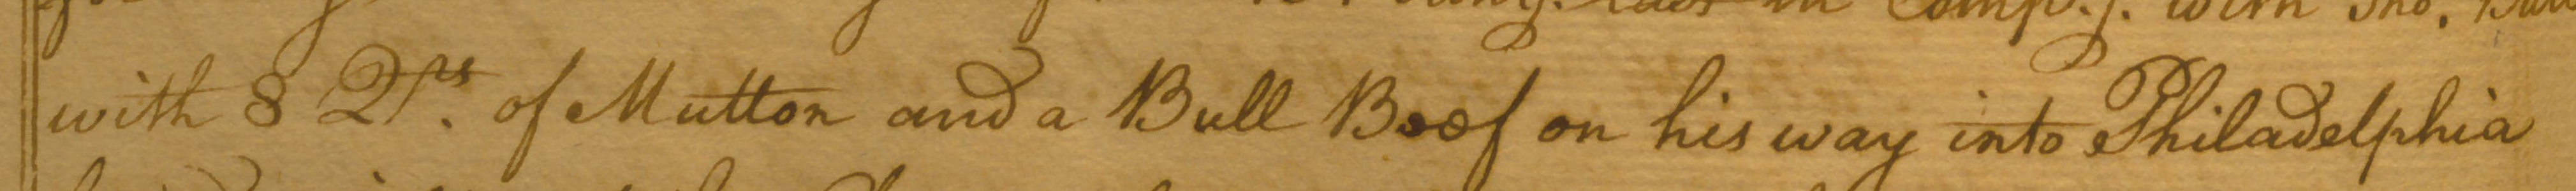with 8 Q^rs. of Mutton and a Bull Beef on his way into Philadelphia
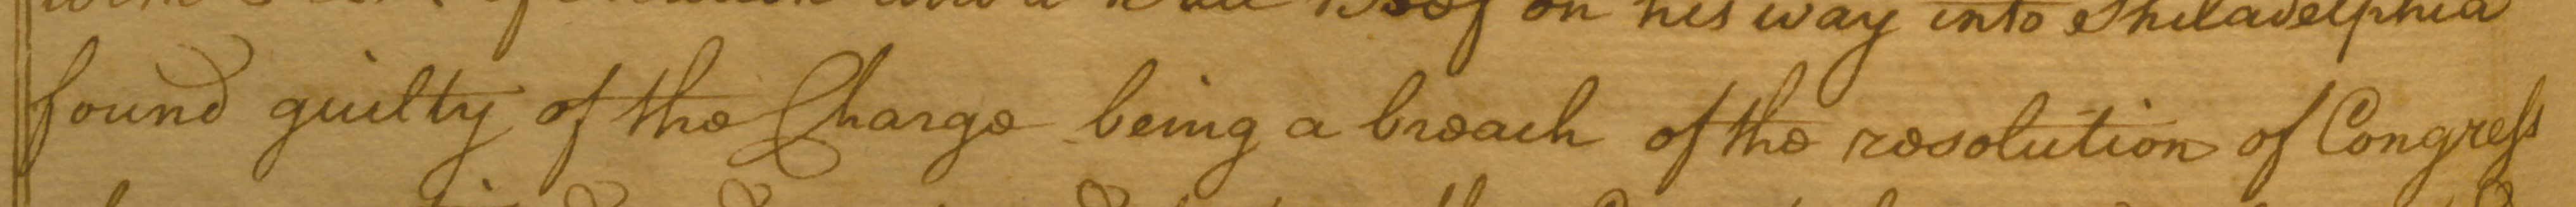found guilty of the Charge being a breach of the resolution of Congress
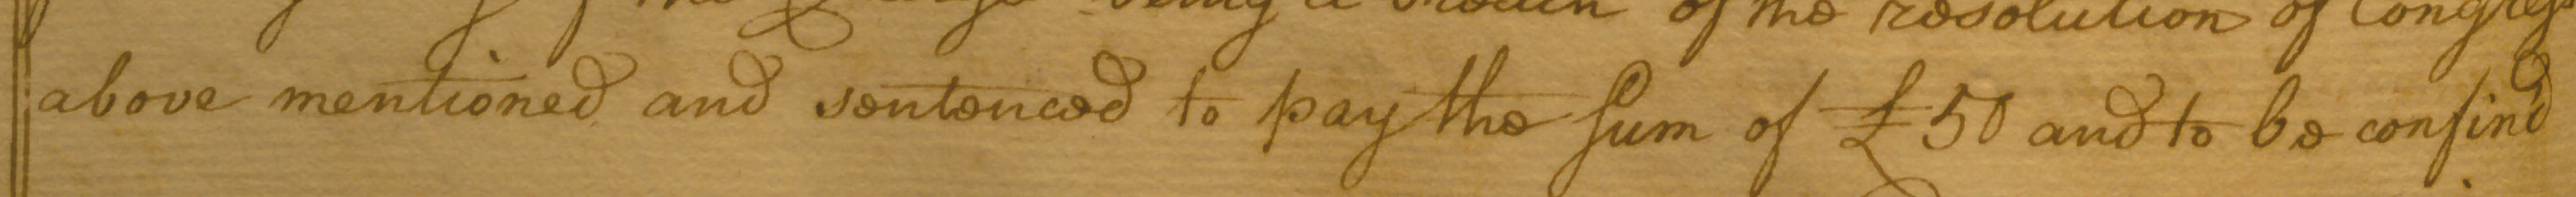above mentioned and sentenced to pay the sum of £50 and to be confin'd
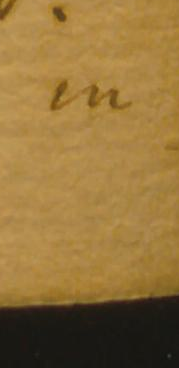in
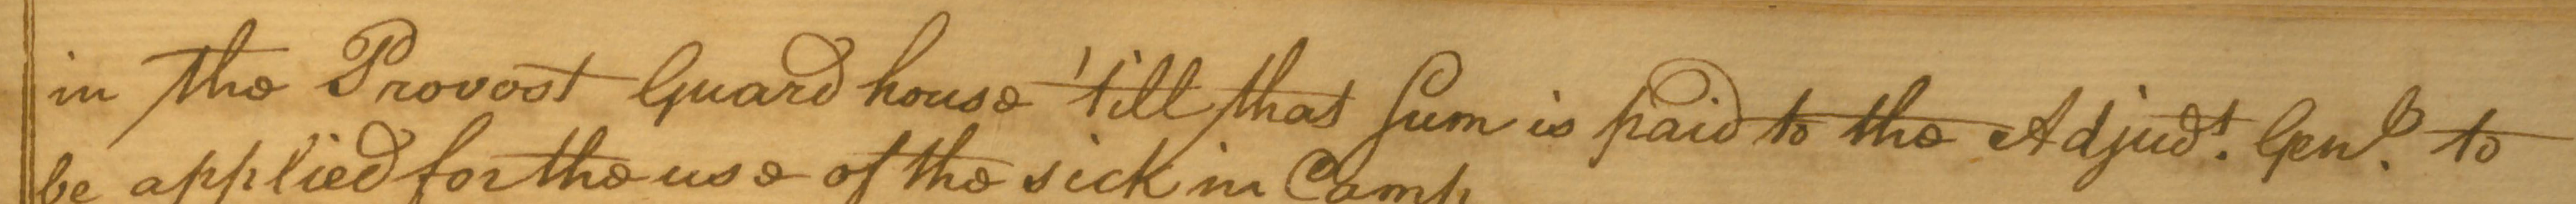in the Provost Guard house 'till that sum is paid to the Adjud^t. Gen^l. to
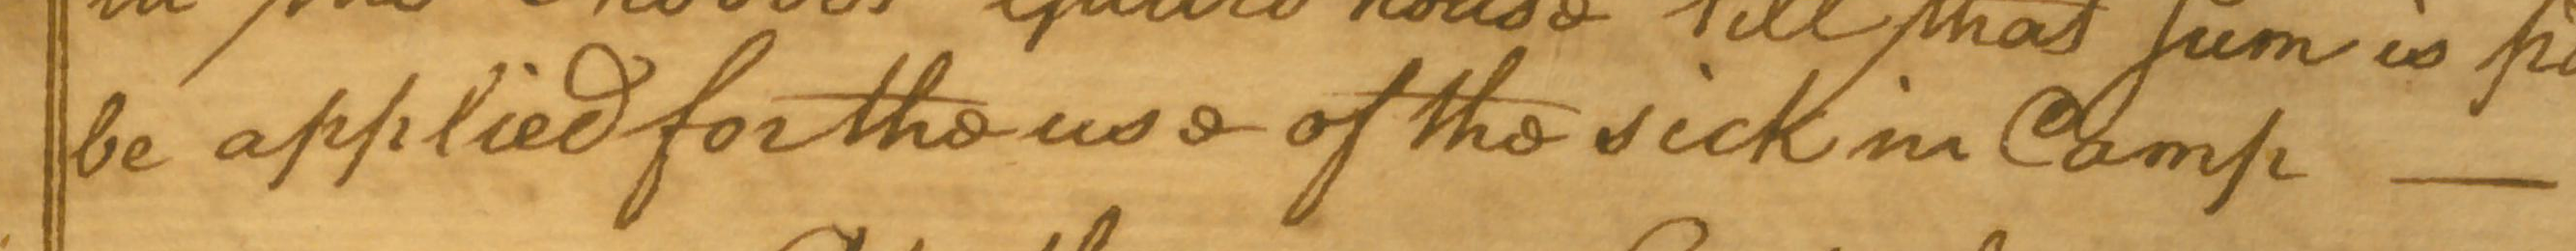be applied for the use of the sick in Camp-
